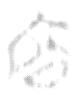容
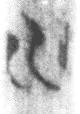川
